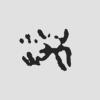澫
